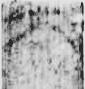大
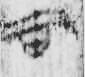司
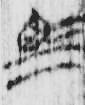馬
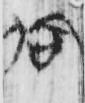卲
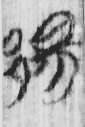{邑昜}（陽）
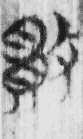敗
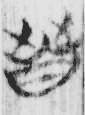晉
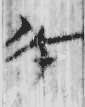帀
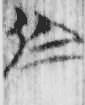於
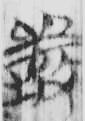襄
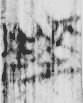陵
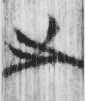之
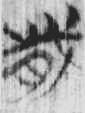歲（歲）
